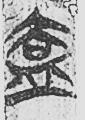盍
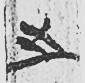之
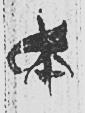民
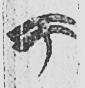于
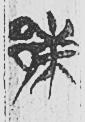邾
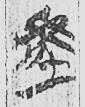𫊟
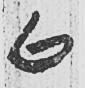㠯（以）
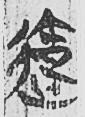御
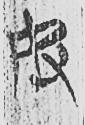奴
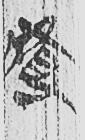虘B
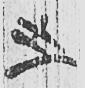之
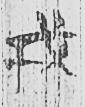戎
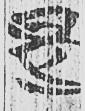是
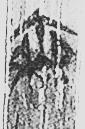秦
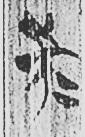先=
